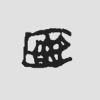匿
